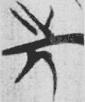先
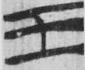王
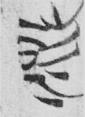灋（廢）
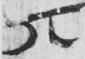亓（其）
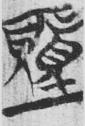○（貢）
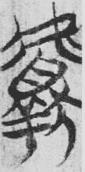獻
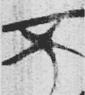不
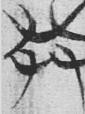共
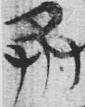氶（承）
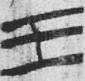王
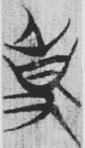事
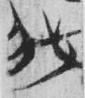我
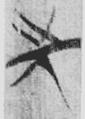先
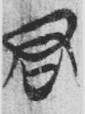君
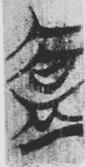盍（闔）
